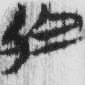於
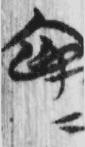躬身
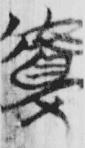○（且）
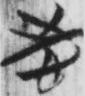志
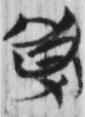事
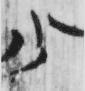少
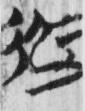○（遲）
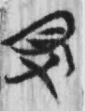○（得）
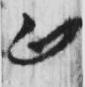㠯（以）
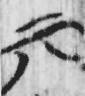亓（其）
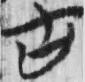古（故）
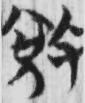敓
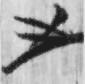之
